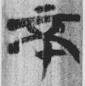不
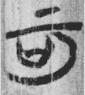可
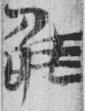唯（雖）
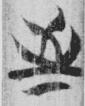至
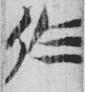於
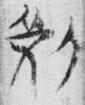死
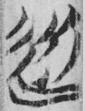從
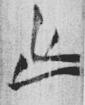之
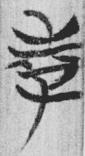孝
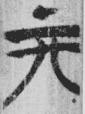而
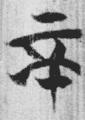不
